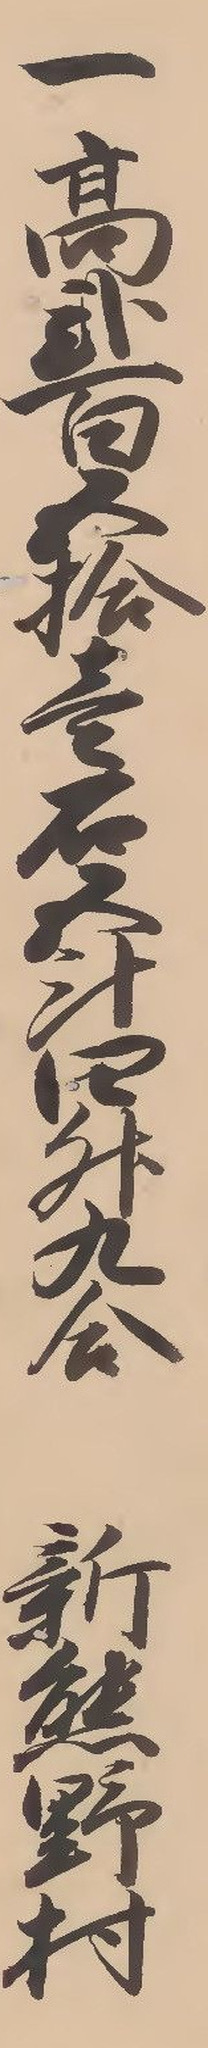一高弐百五拾壱石五斗四升九合新熊野村
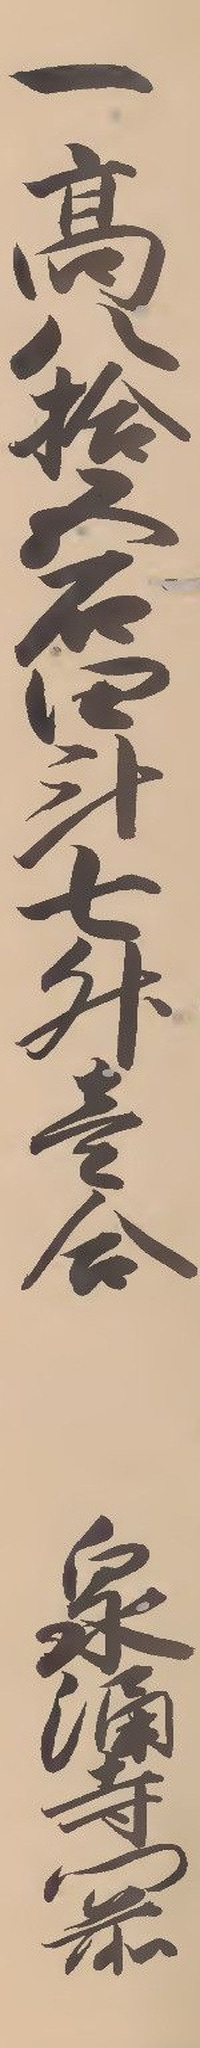一高八拾五石四斗七升壱合泉湧寺門前
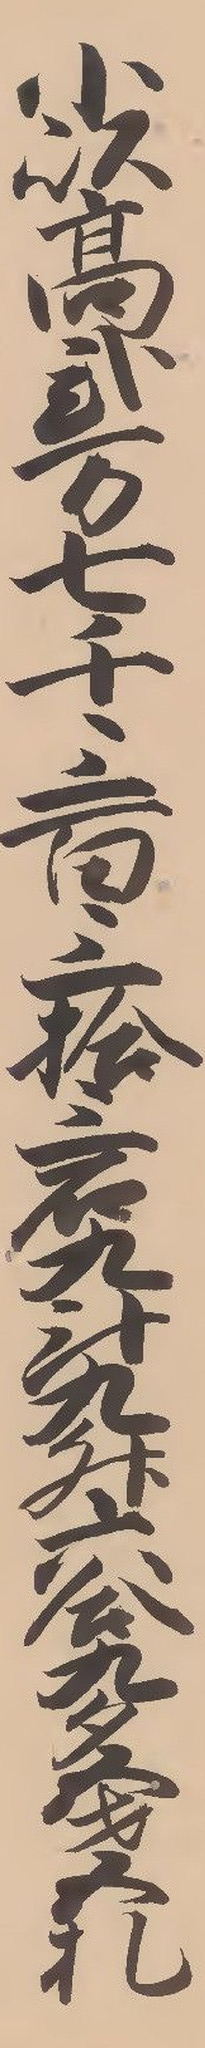小以高弐万七千三百三拾三石九斗九升六合九勺五才五札

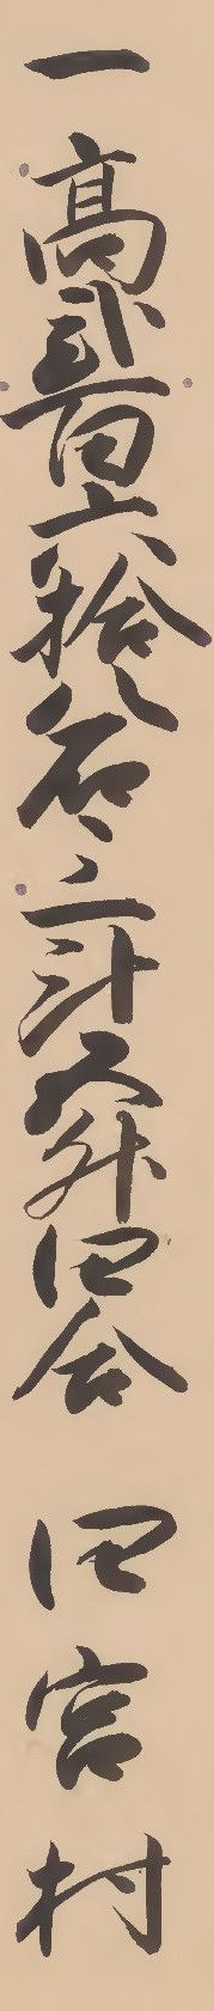一高弐百六拾八石三斗五升四合四宮村
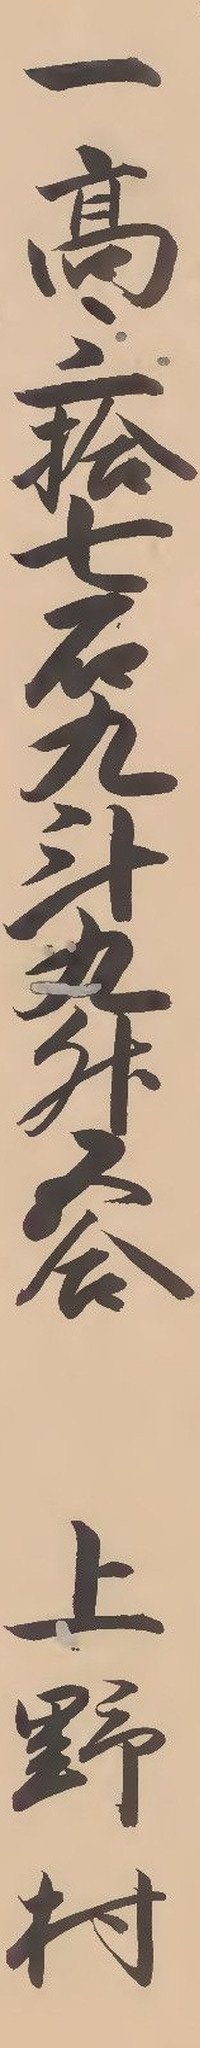一高三拾七石九斗九升五合上野村
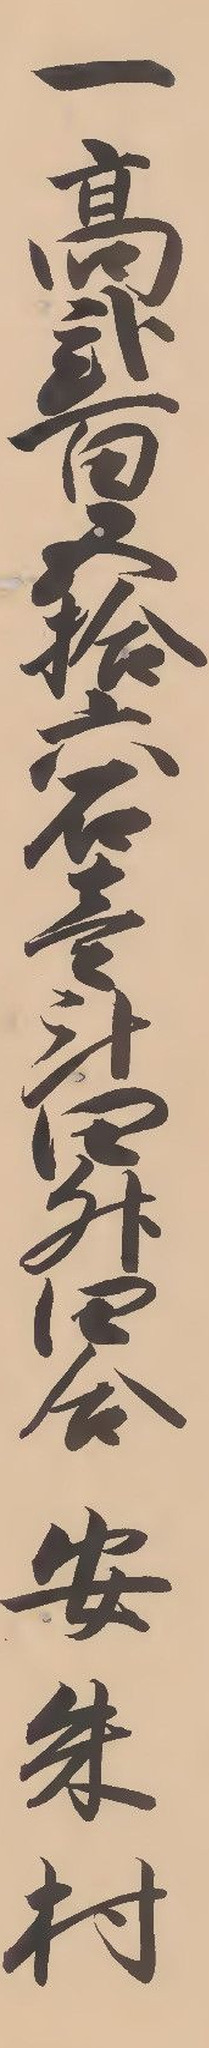一高弐百五拾六石壱斗四升四合安朱村
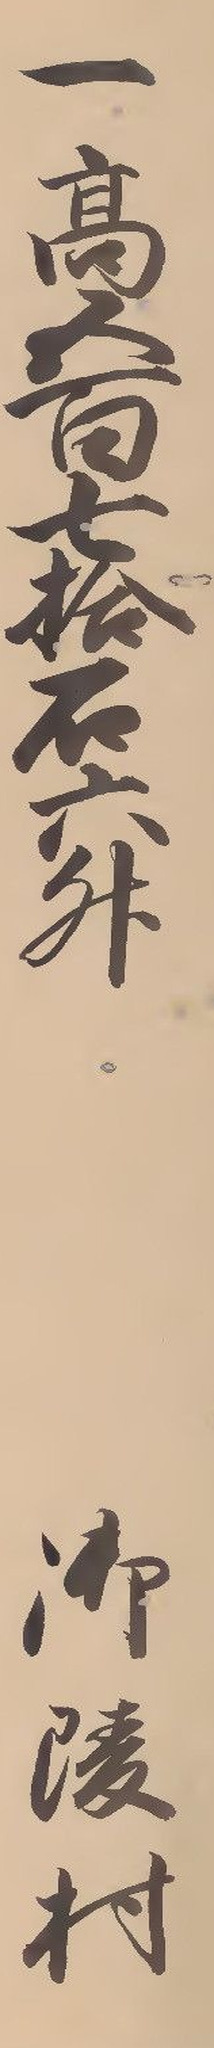一高五百七拾石六升御陵村
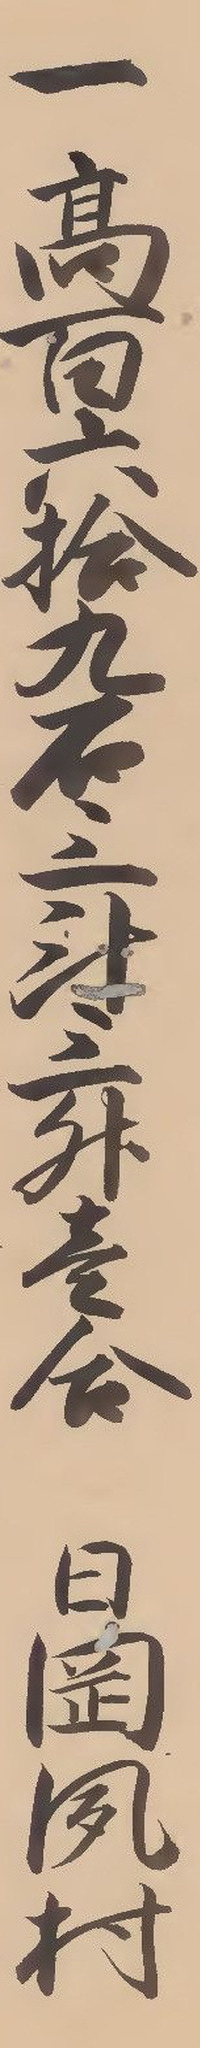一高百六拾九石三斗三升壱合日岡夙村
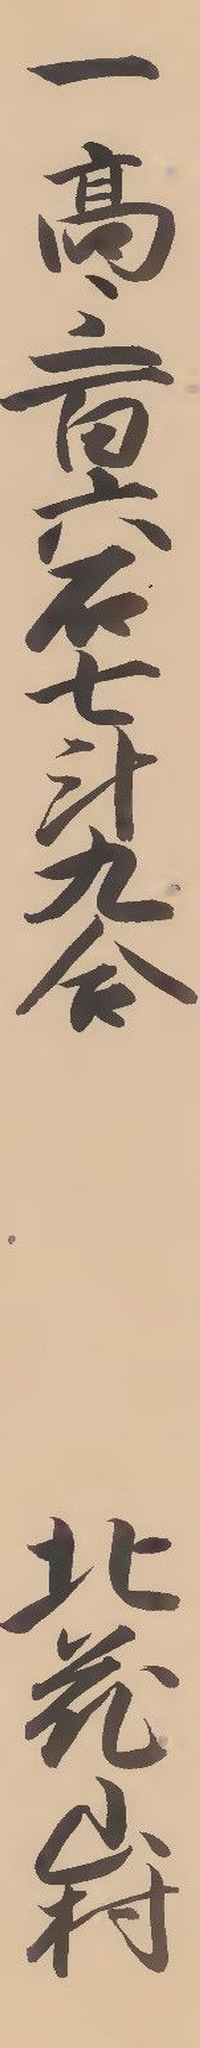一高三百六石七斗九合北花山村
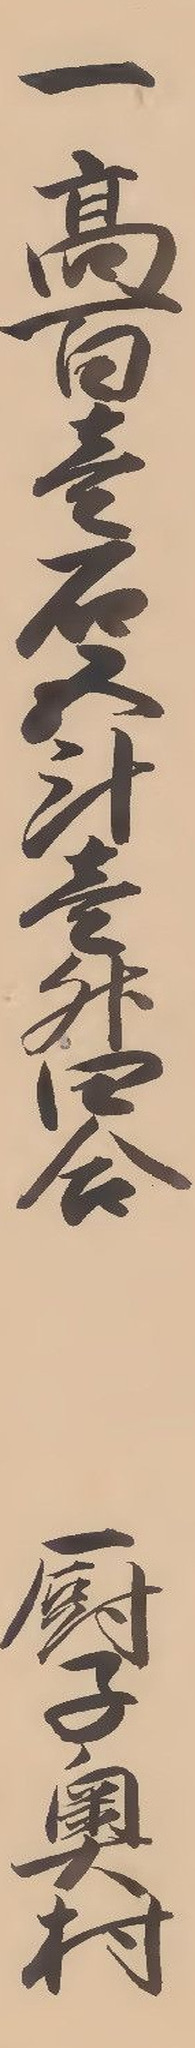一高百壱石五斗壱升四合厨子奥村

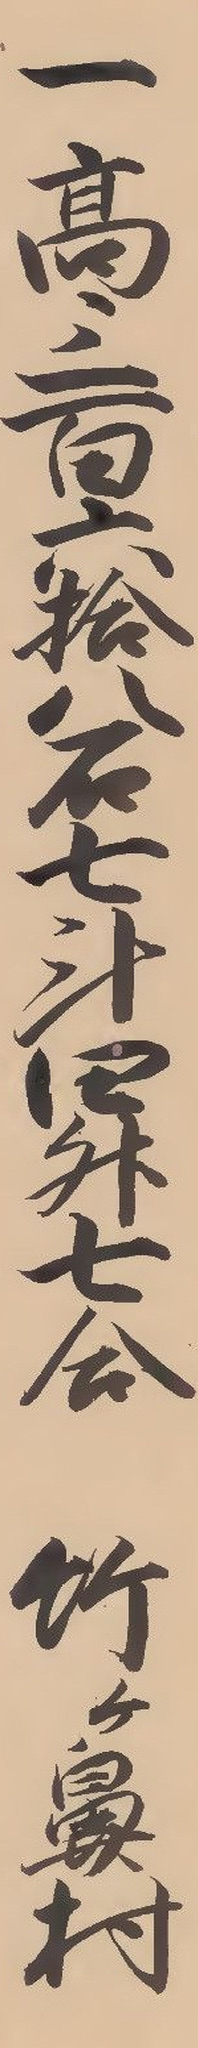一高三百六拾八石七斗四升七合竹ヶ鼻村
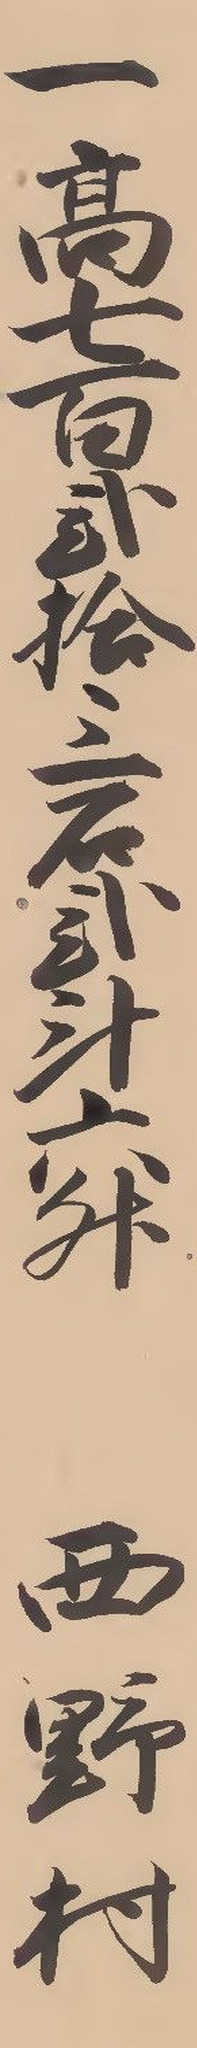一高七百弐拾三石弐斗六升西野村
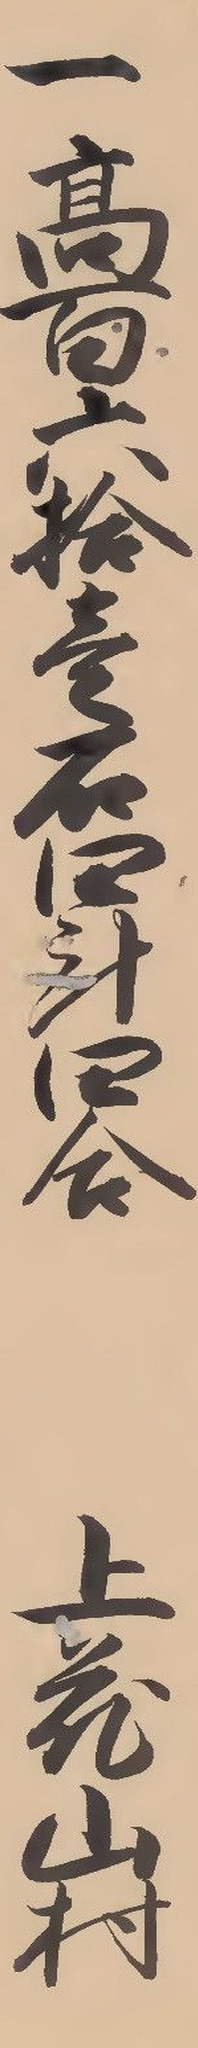一高百六拾壱石四斗四合上花山村
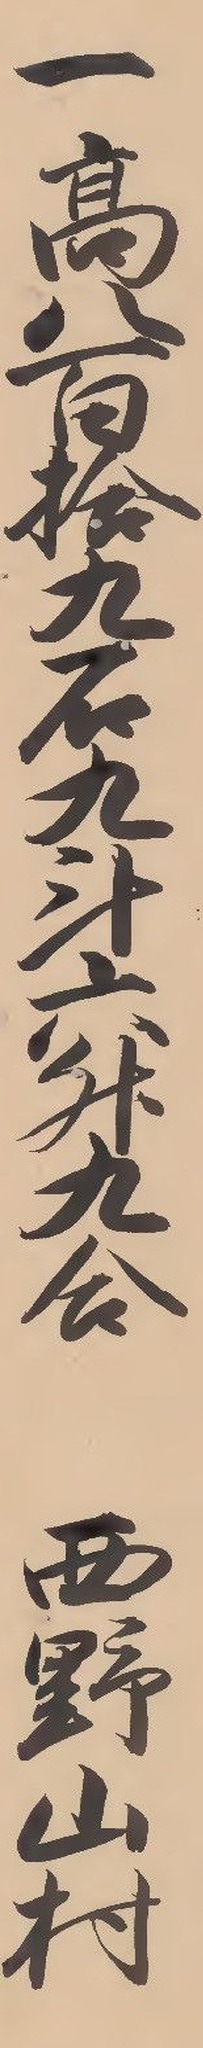一高八百拾九石九斗六升九合西野山村
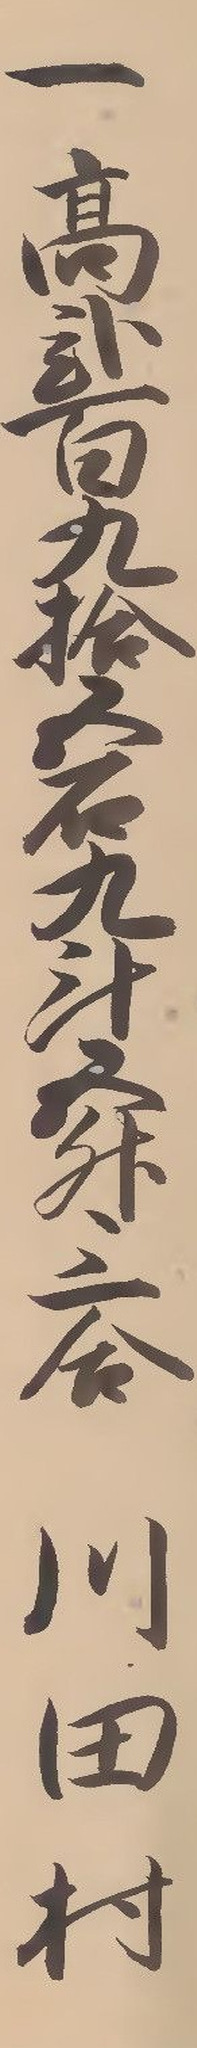一高弐百九拾五石九斗五升三合川田村
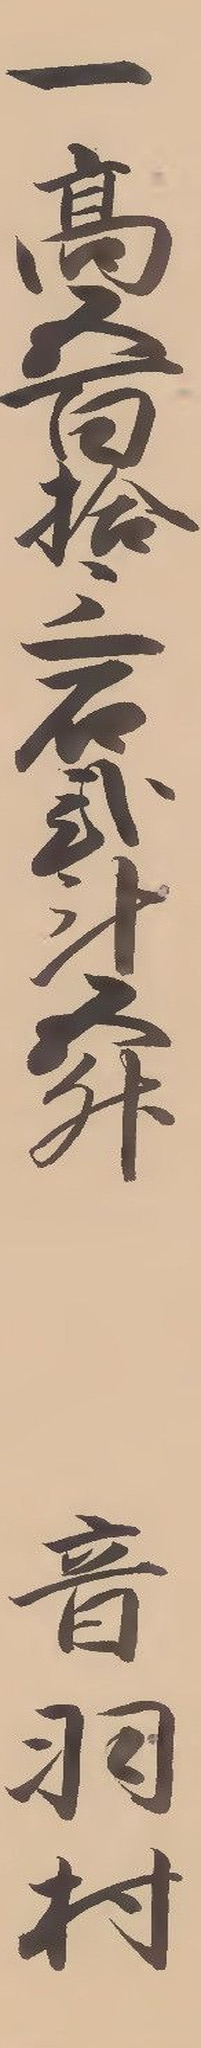一高五百拾三石弐斗五升音羽村
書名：山城国郷帳
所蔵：国立公文書館 National Archives of Japan
